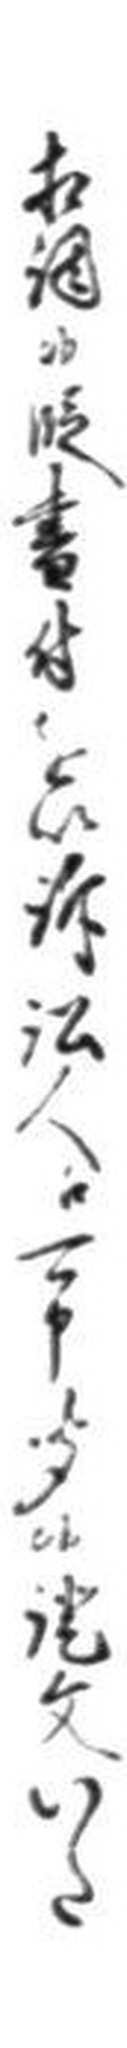相調候段書付を以訴訟人江可申聞候証文いた
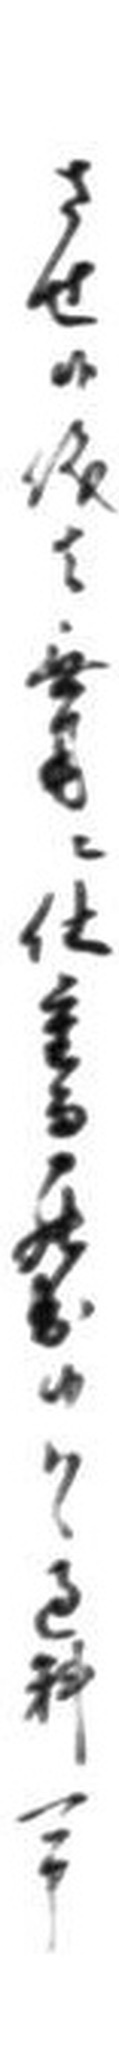させ候者無用ニ仕重而罷出候ハヽ過料可申
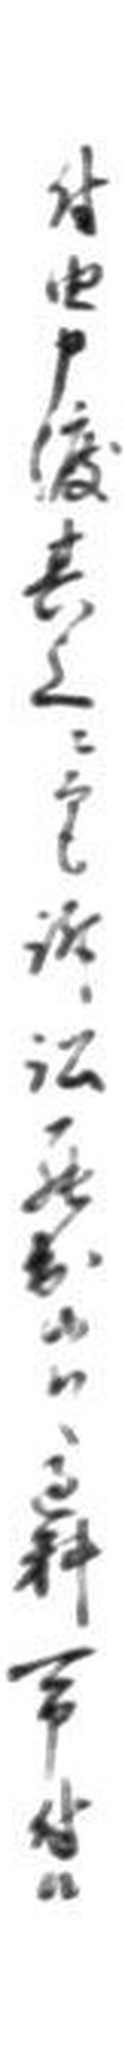付由申渡其上ニ而も訴訟罷出候ハヽ過料可申付候
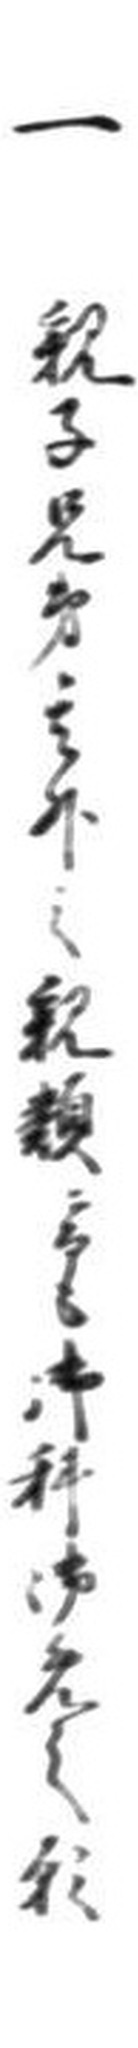一親子兄弟其の外之親類ニ而も御科御免之願
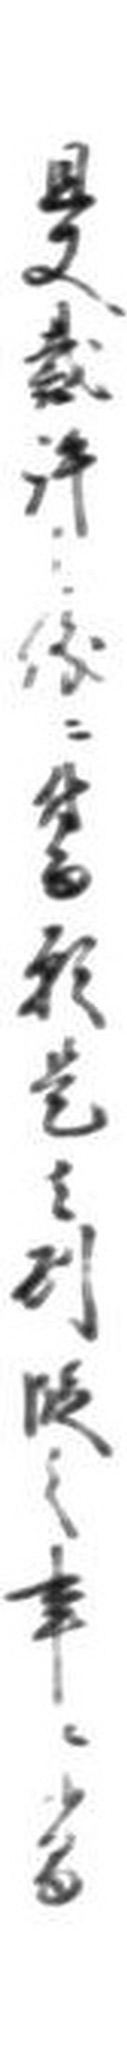且又裁許之儀ニ付而も願是者別段之事ニ候間
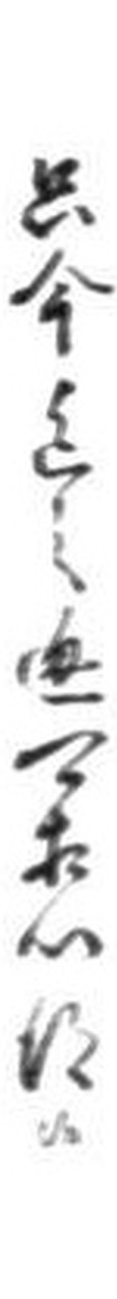只今迄之通可相心得候
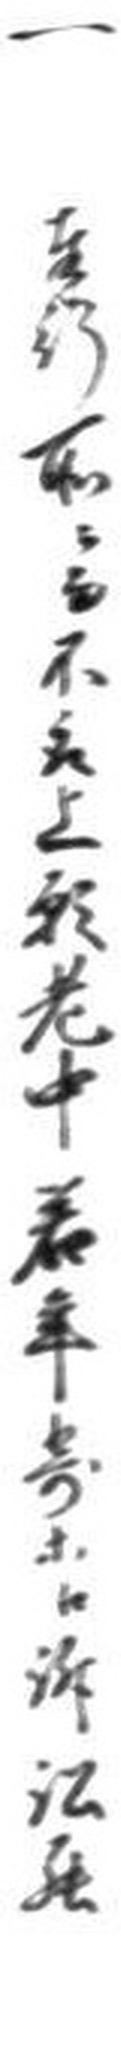一奉行所ニ而不取上願老中若年寄等江訴訟罷
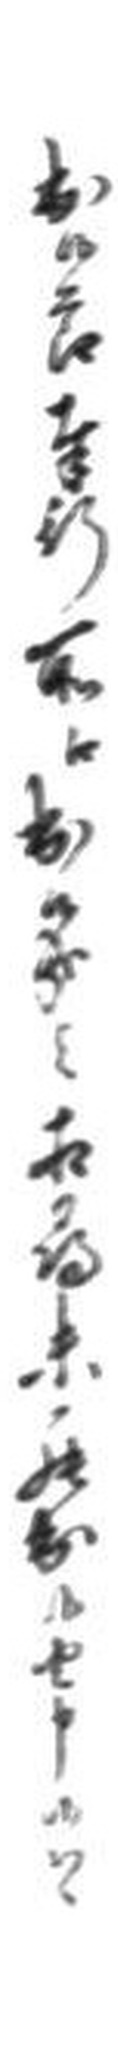出候節奉行所江出候哉与相尋未罷出候由申候ハヽ
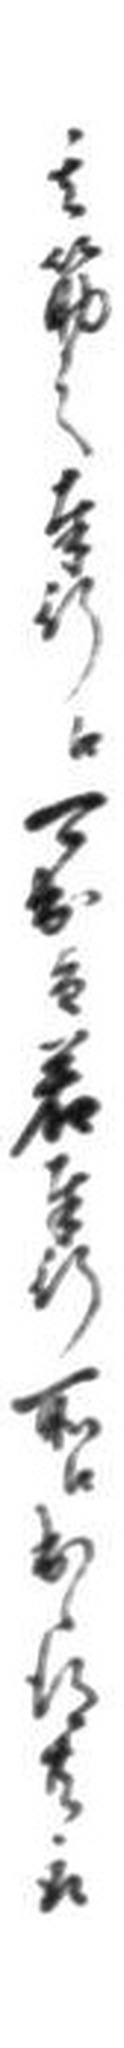其節之奉行江可出旨若奉行所江出候得共取
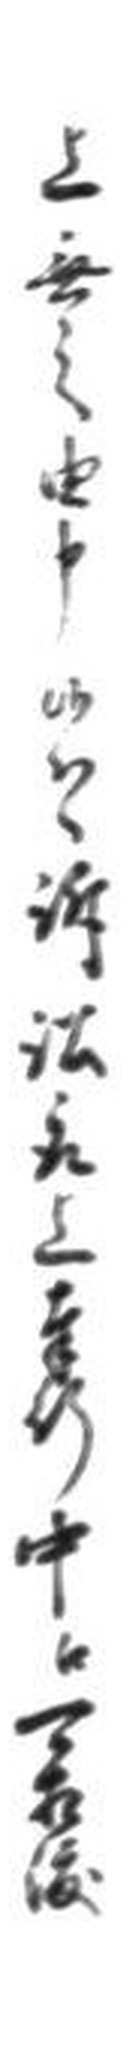上無之由申候ハヽ訴訟取上奉行中江相渡

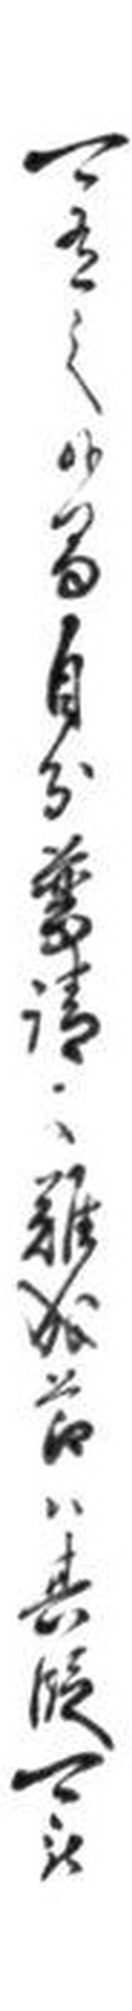可有之候間自分普請に難成節ハ其段可被
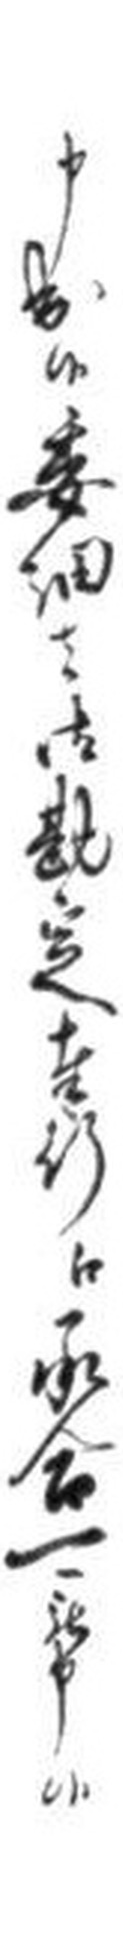申出候委細者御勘定奉行江承合可被申候
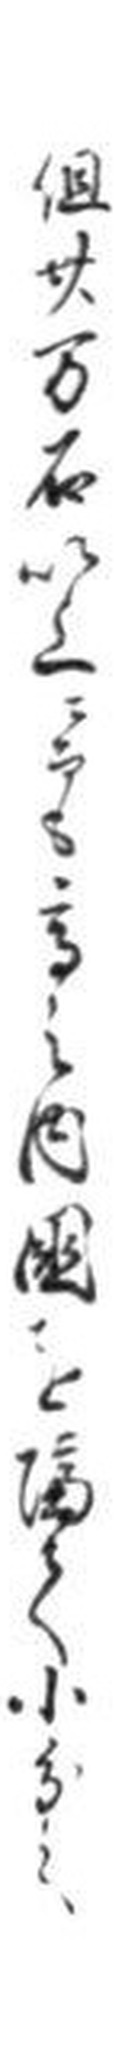但廿万石以上ニ而も高之内国を隔て小分之
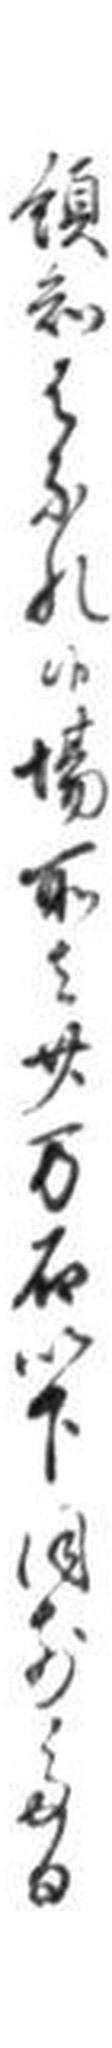領地はふれ候場所者廿万石以下同前多日
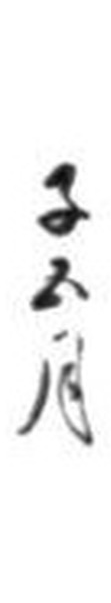子五月
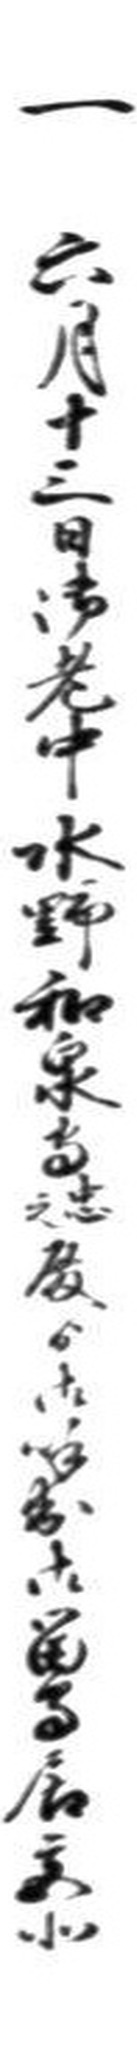一六月十三日御老中水野和泉守忠之殿ゟ御呼出御留守居宮北
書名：家譜 三十四 吉邦公 従享保五年到同六年
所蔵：福井県文書館 Fukui Prefectural Archives
